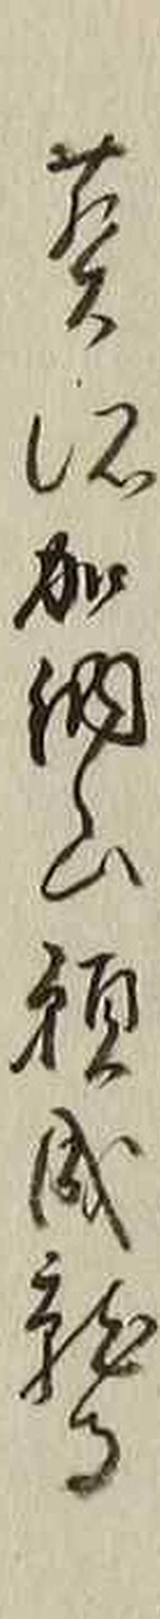葬所加納山願成就寺
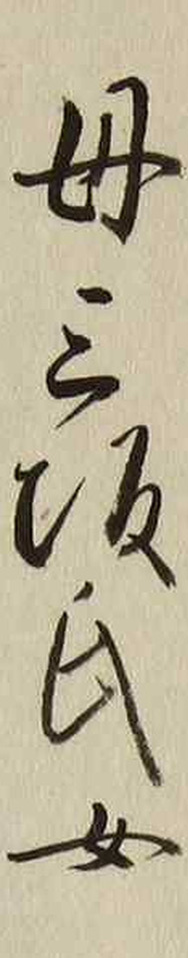母三坂氏女
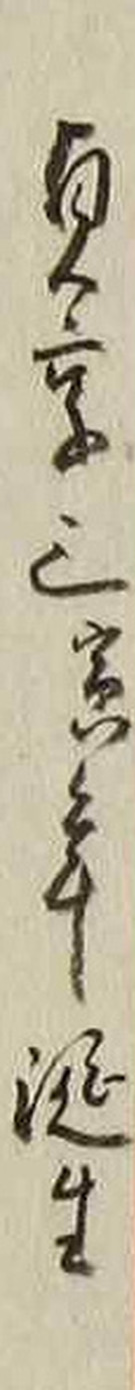貞享三寅年誕生
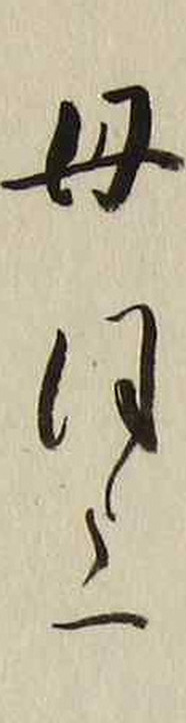母同上
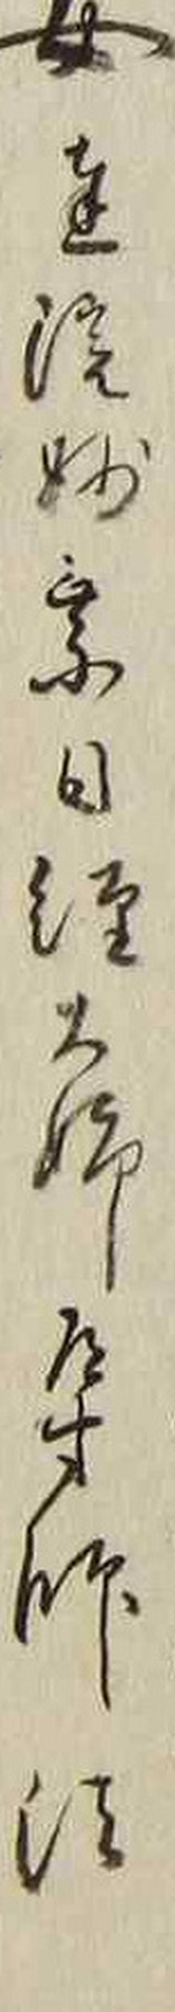達院妙乗日経大姉導師法
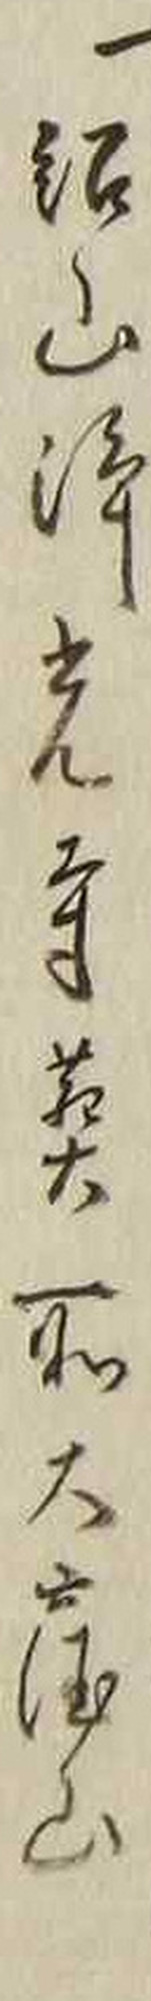紹山浄光寺葬所大窪山

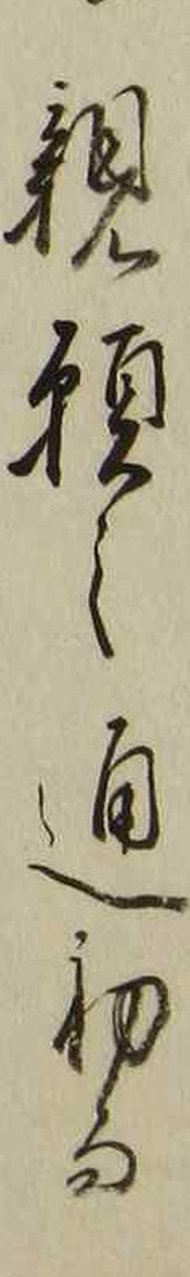詳親願之通初而
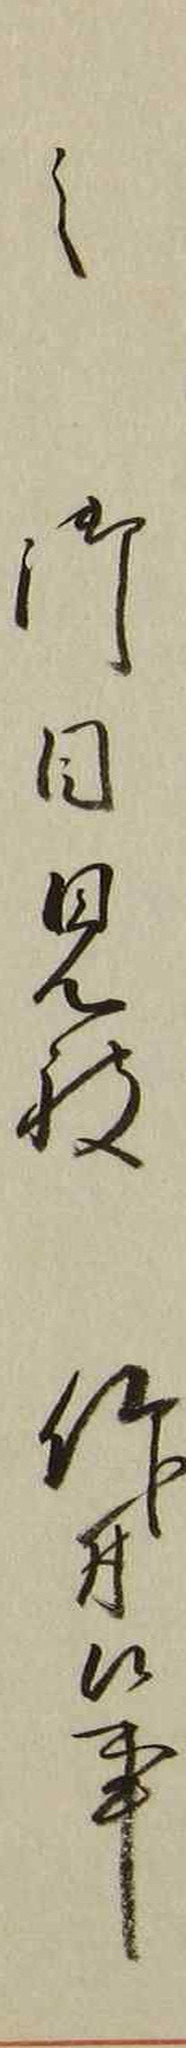之御目見被仰付候事
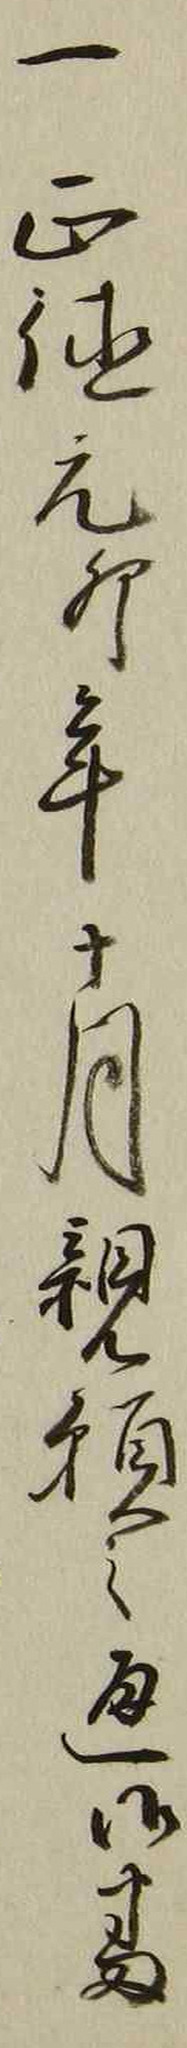一正徳元卯年十月親願之通御番
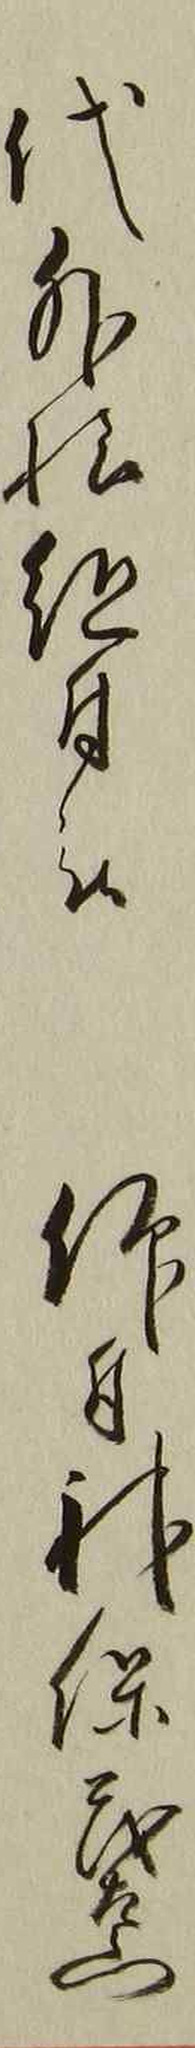代外様組付被仰付神保茂左衛門
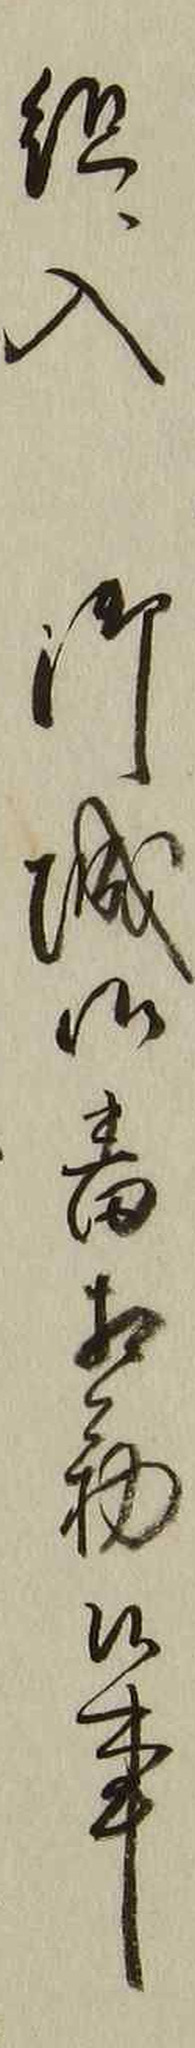組へ入御城御番相勤候事
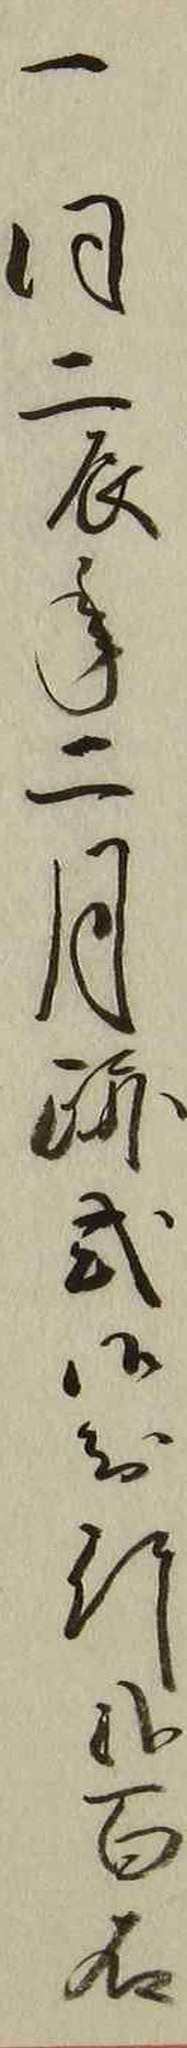一同二辰年二月跡式御知行弐百石
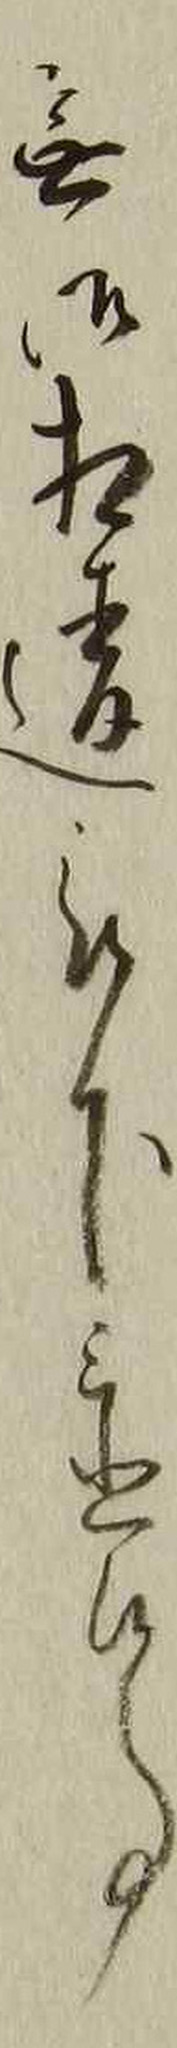無御相違被下置候事
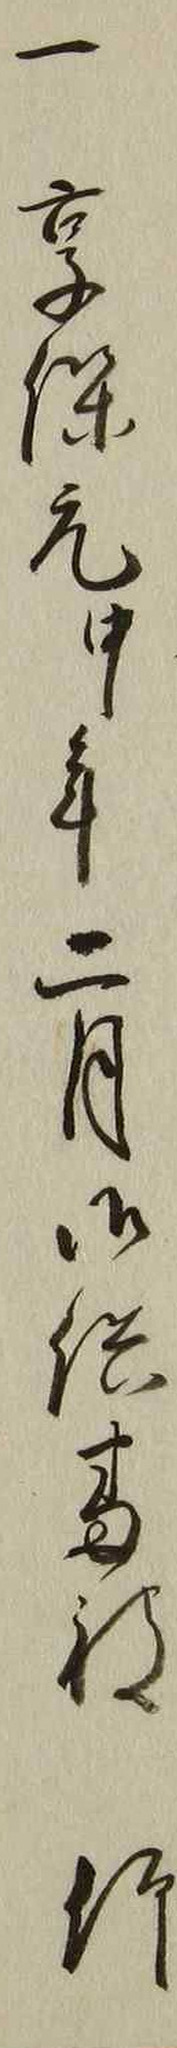一享保元申年二月御供番被仰
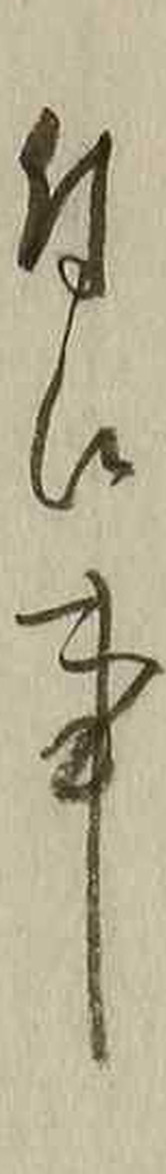付候事
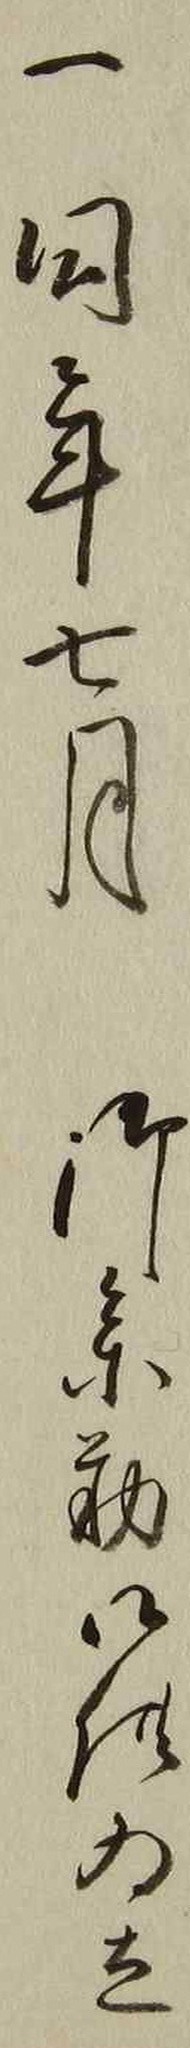一同年七月御参勤御供為立
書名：諸士系譜　巻之2　い之部2
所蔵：会津若松市立会津図書館
